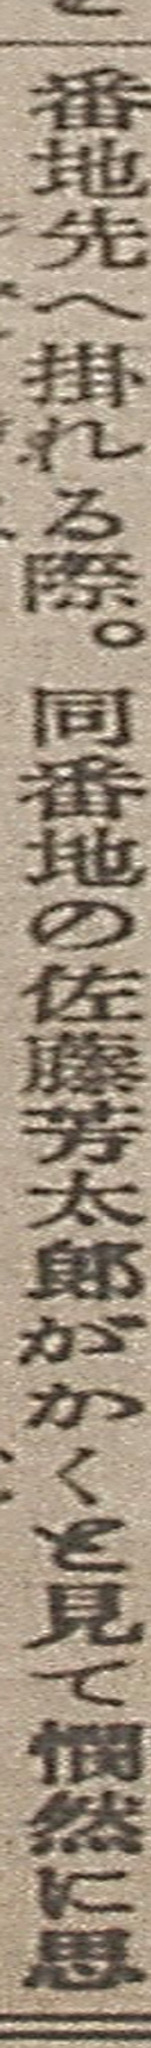番地先へ掛れる際。同番地の佐藤芳太郎がかくと見て憫然に思
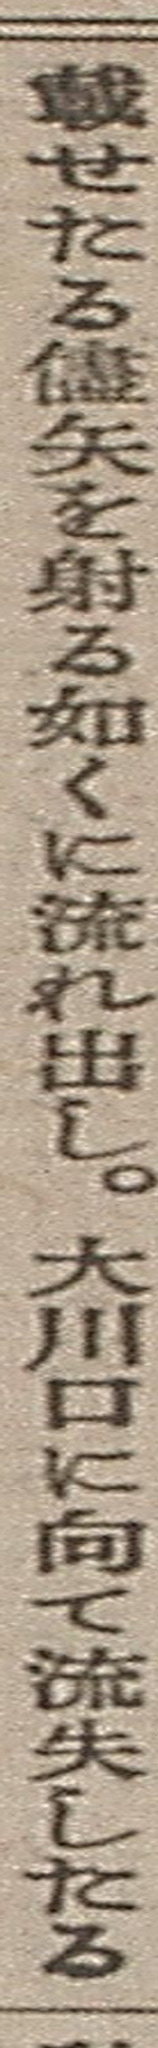載せたる侭矢を射る如くに流れ出し。大川口に向て流失したる
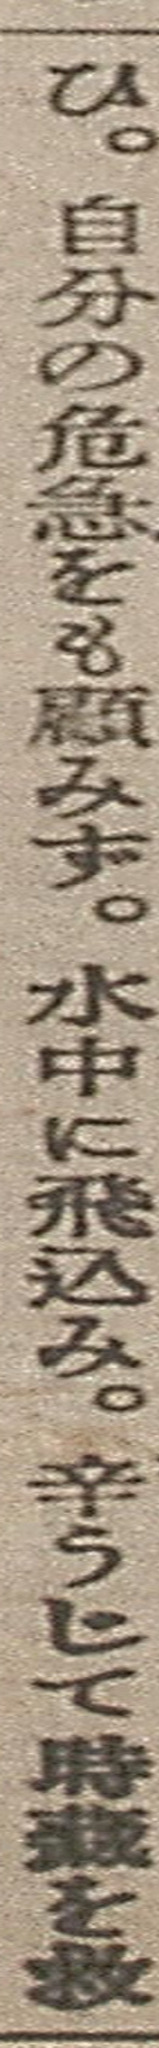ひ。自分の危急をも顧みず。水中に飛込み。辛うじて時蔵を救
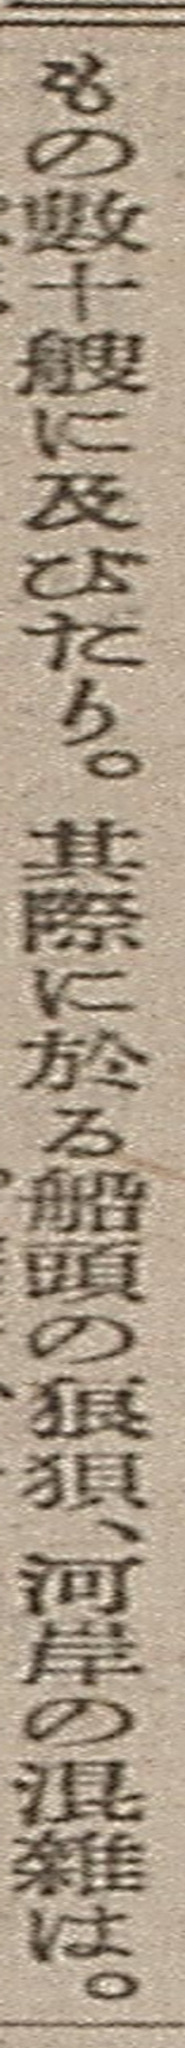もの数十艘に及びたり。其際に於る船頭の狼狽、河岸の混雑は。
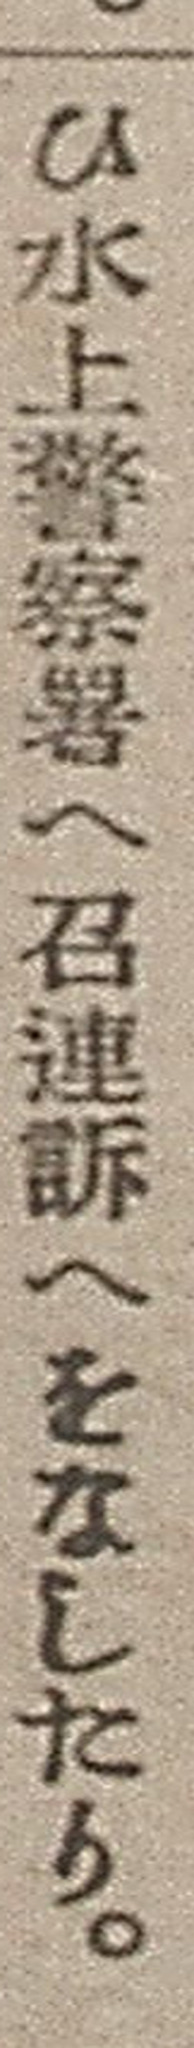ひ水上警察署へ召連訴へをなしたり。
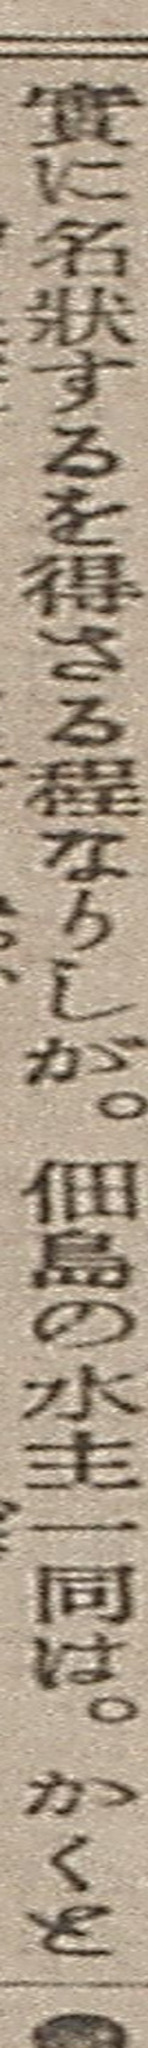実に名状するを得さる程なりしが。佃島の水主一同は。かくと
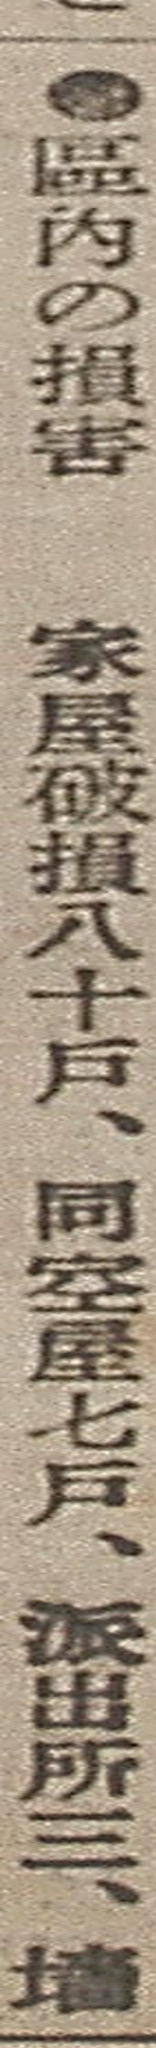●区内の損害家屋破損八十戸、同空家七戸、派出所三、墻
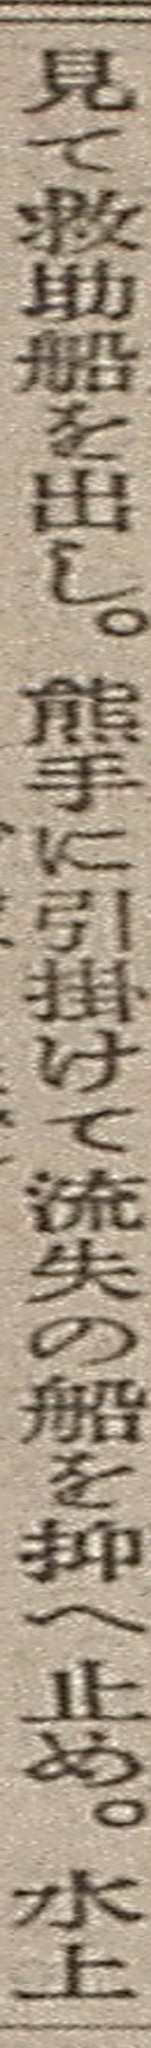見て救助船を出し。熊手に引掛けて流失の船を抑へ止め。水上
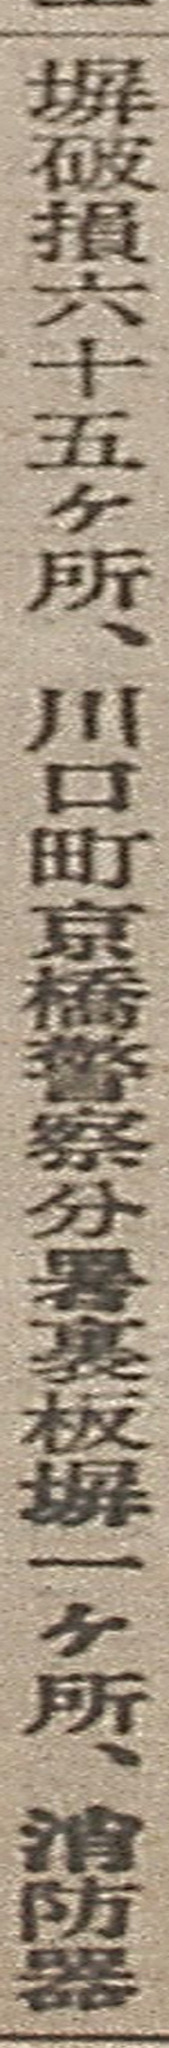塀破損六十五ケ所、川口町京橋警察分署裏板塀一ケ所、消防器
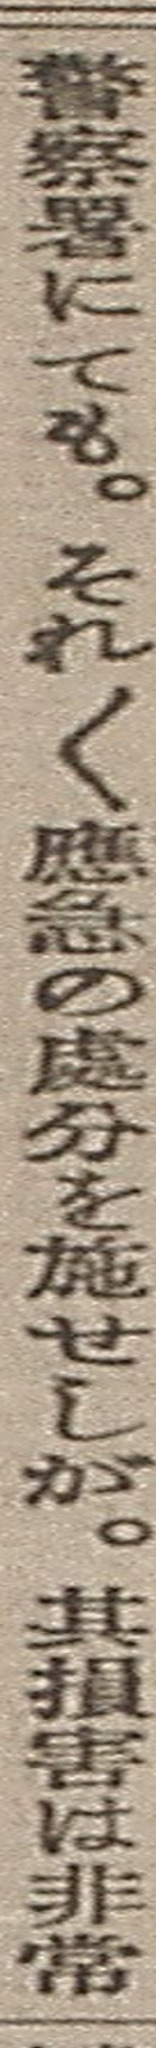警察署にても。それ〳〵応急の処分を施せしが。其損害は非常
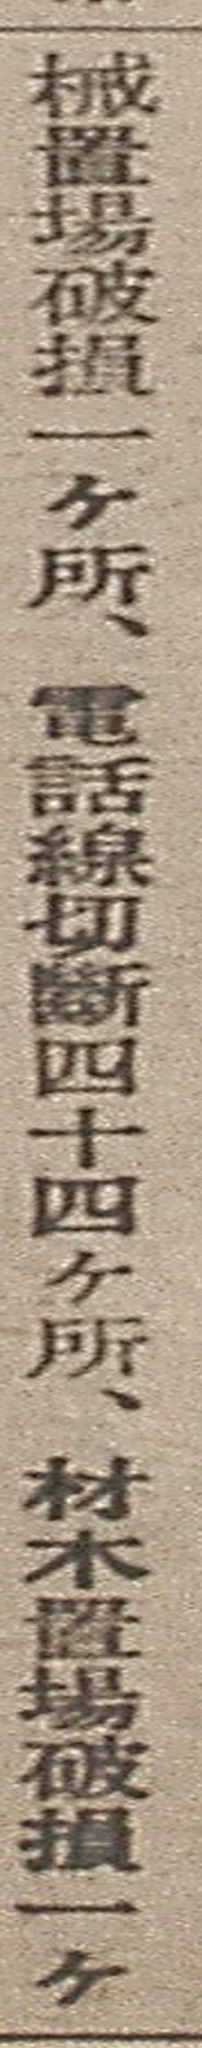械置場破損一ケ所、電話線切断四十四ケ所、材木置場破損一ケ
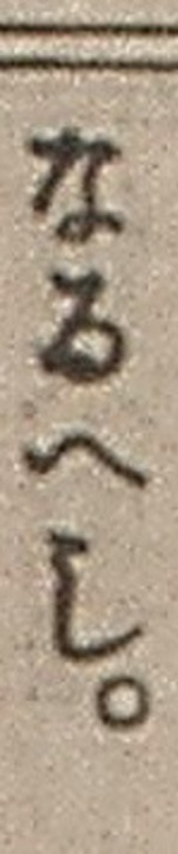なるへし。
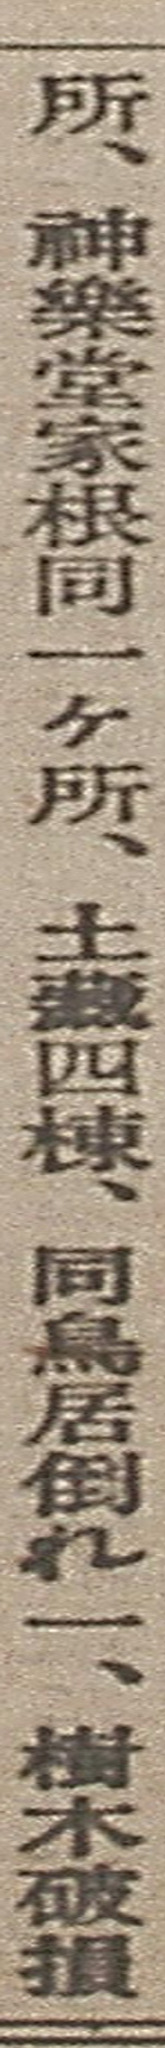所、神楽堂家根同一ケ所、土蔵四棟、同鳥居倒れ一、樹木破損
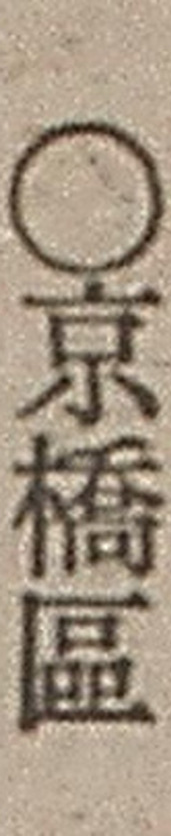〇京橋区
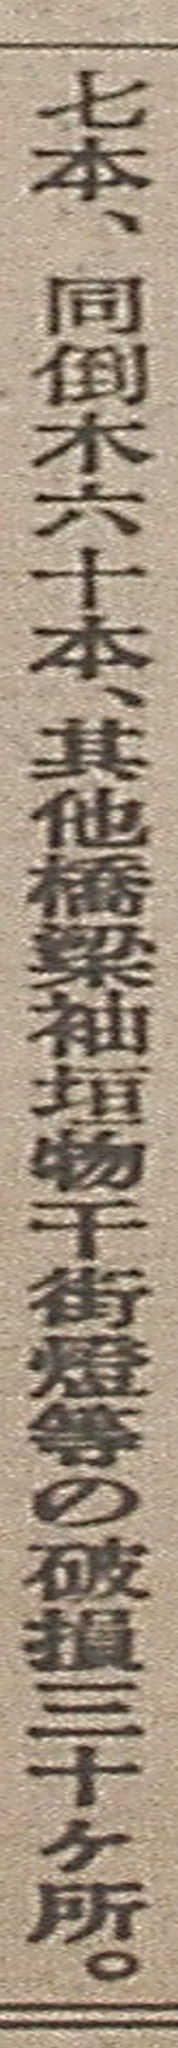七本、同倒木六十本、其他橋梁袖垣物干街燈等の破損三十ケ所。
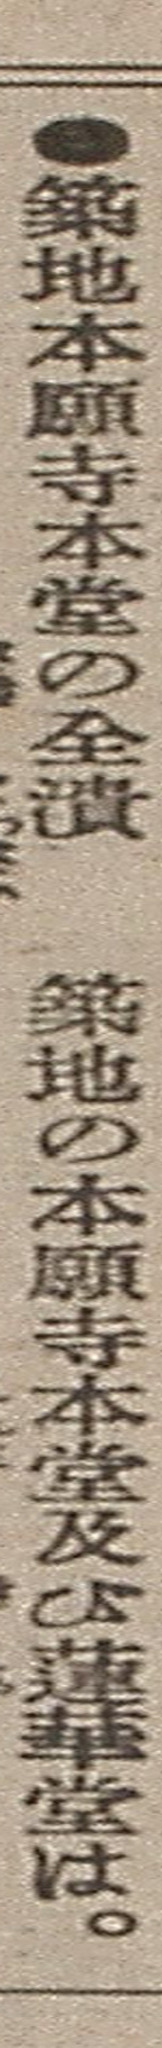●築地本願寺本堂の全潰築地の本願寺本堂及び蓮華堂は。
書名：風俗畫報臨時増刊第百九十九號　明治三十二年十月各地災害圖會（前編之續）
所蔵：東京大学地震研究所図書室 Earthquake Research Institute Library, The University of Tokyo, JAPAN
